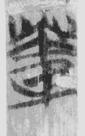{亠舛車}
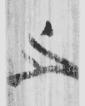之
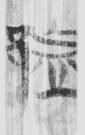都
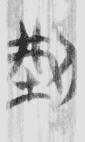型
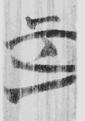正
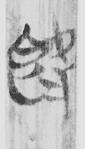既
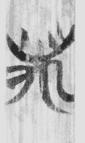萬
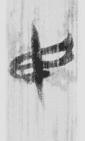民
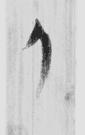人
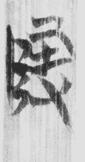{阜左又}
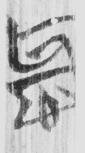怠
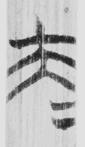夫=
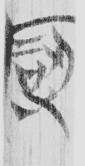叚
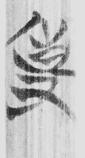事
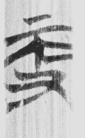{卞又}
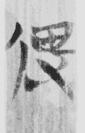俾
